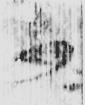月
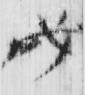戊
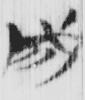戌
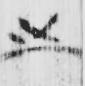之
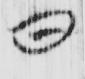日
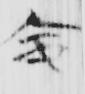○（中）
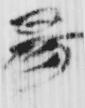昜（陽）
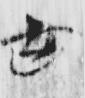玄
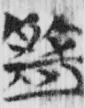盤
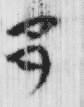邑
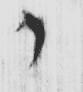人
